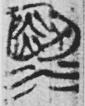○（冽）
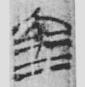寒
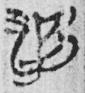湶（泉）
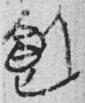飤（食）
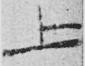上
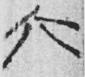六
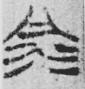汬
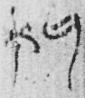朻（救）
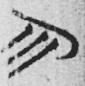勿
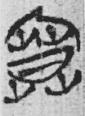寞
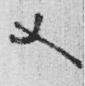又（有）
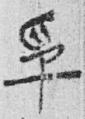孚
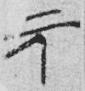元
